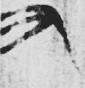又（有）
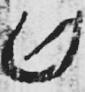㠯（以）
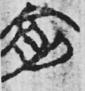俞（喻）
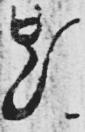也
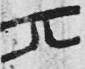亓（其）
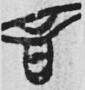言
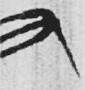又（有）
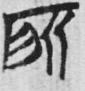所
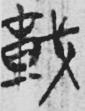載
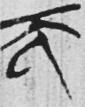而
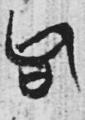句（後）
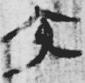內
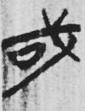或
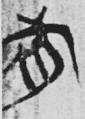前
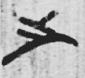之
